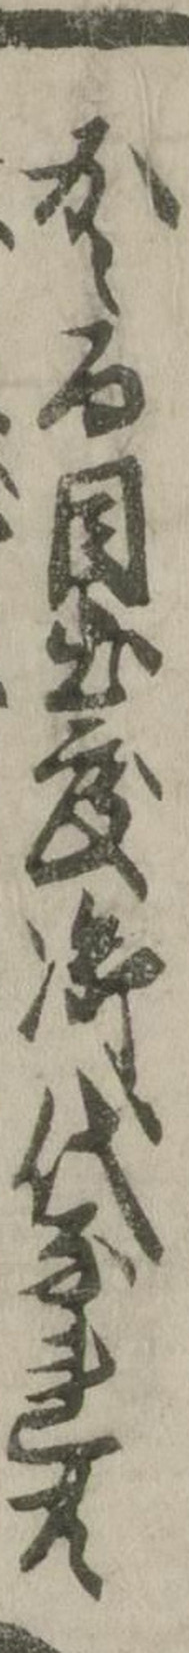かゝる目出度御代なれ共
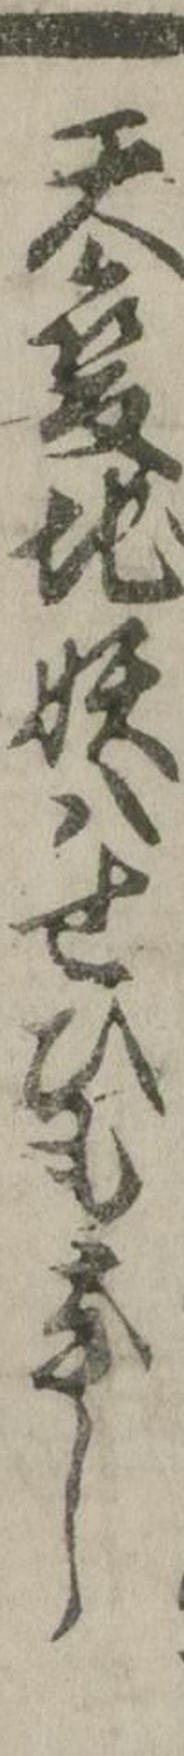天変地妖ハせひもなし
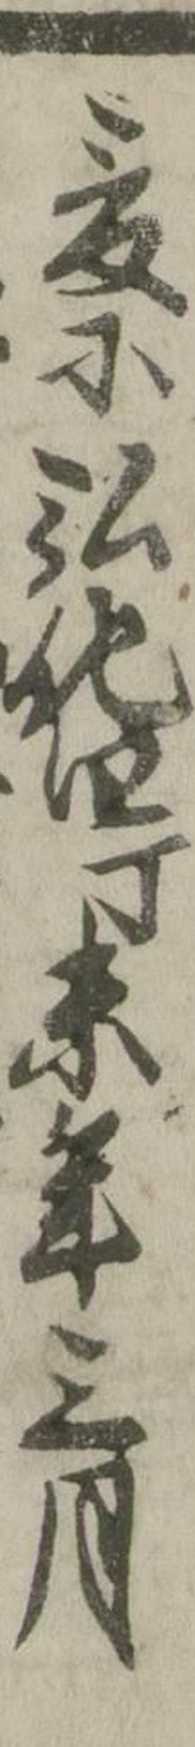爰に弘化四丁未年三月
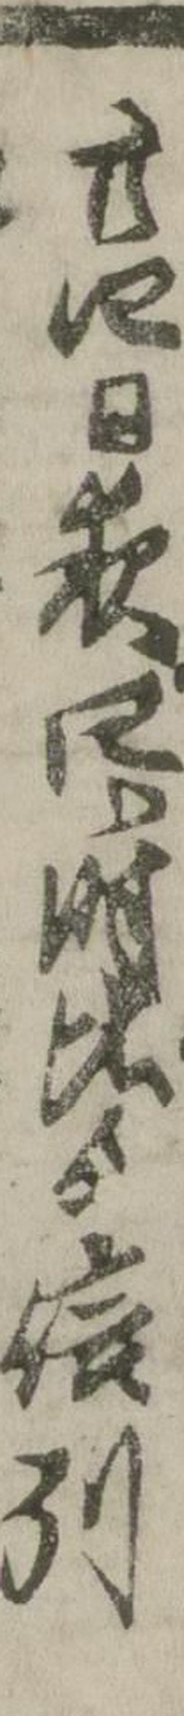廿四日夜四ツ時比ゟ信州
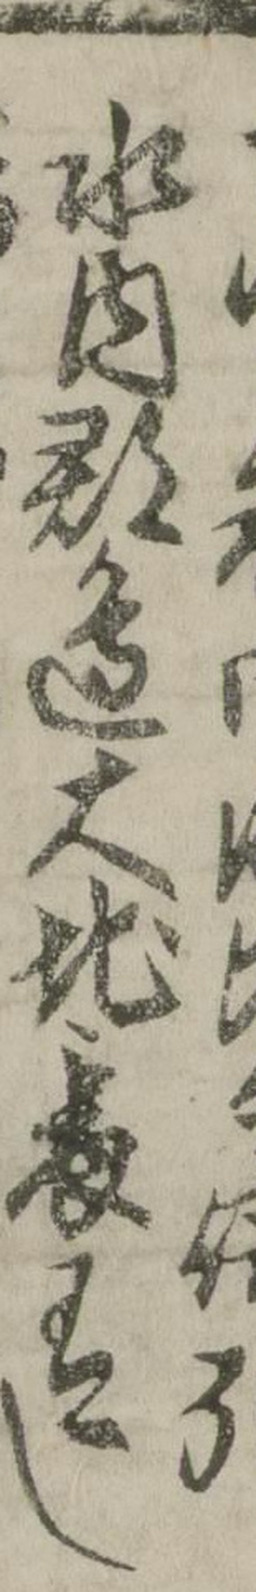水内郡辺大地震有之
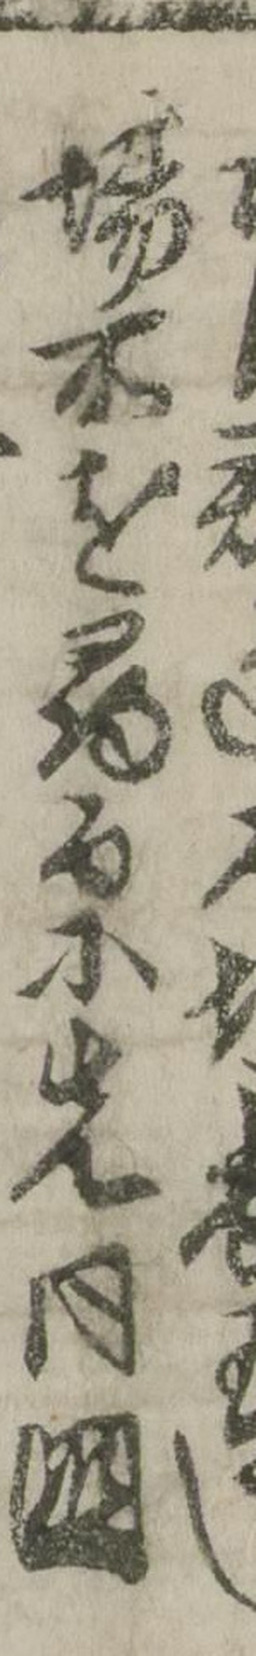場所を尋るに先同国
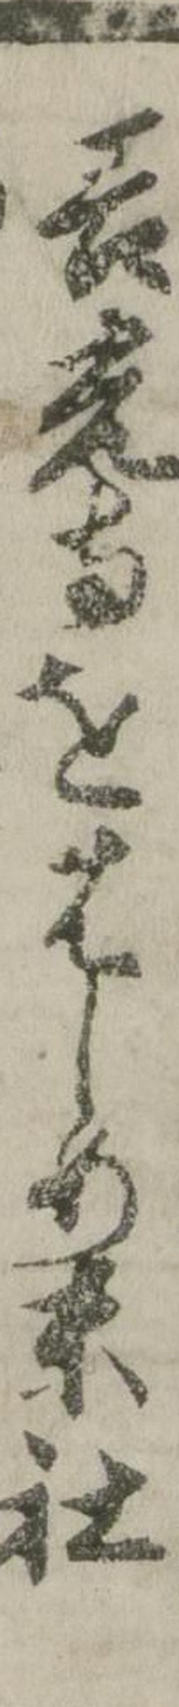善光寺をはしめ末社
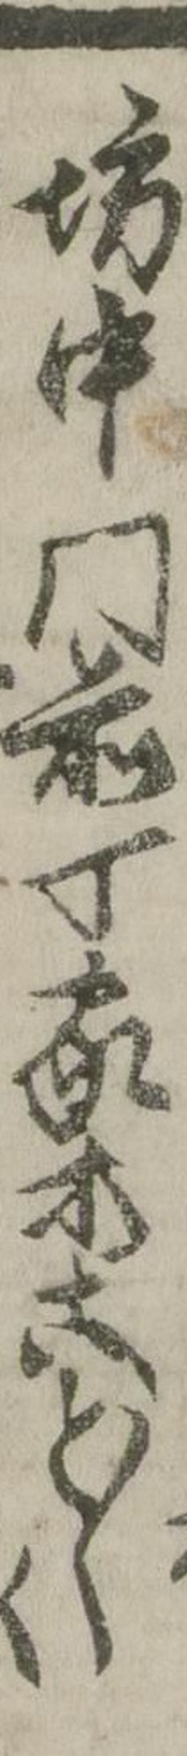坊中門前家丁等こと〳〵く
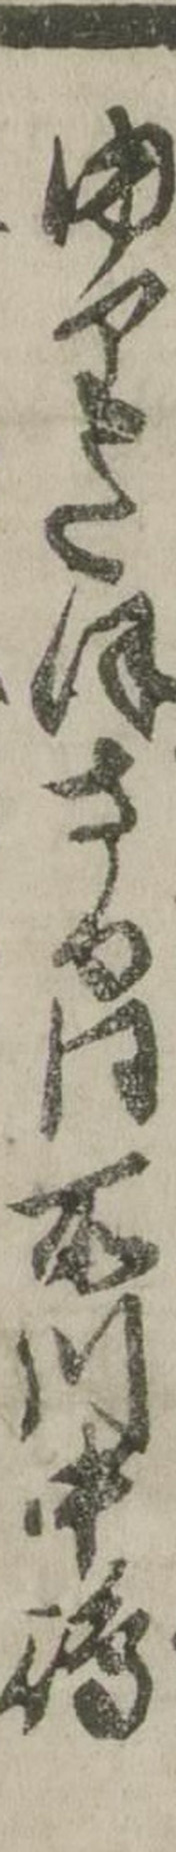ゆりたほさる同所川中嶋
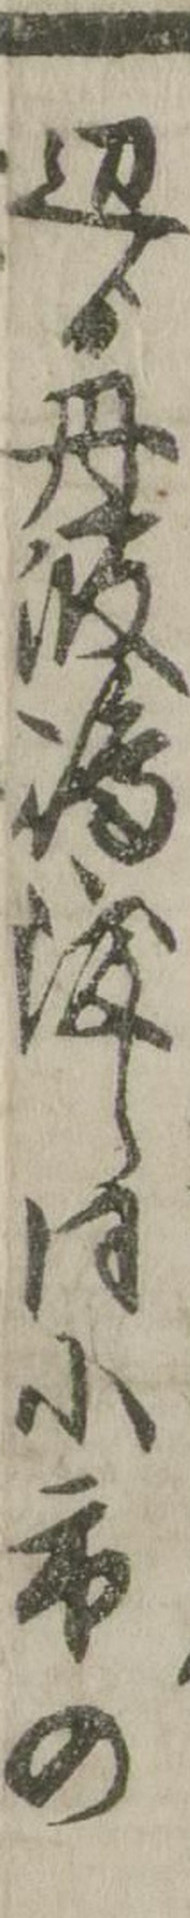辺ゟ丹波嶋渡し同小市の
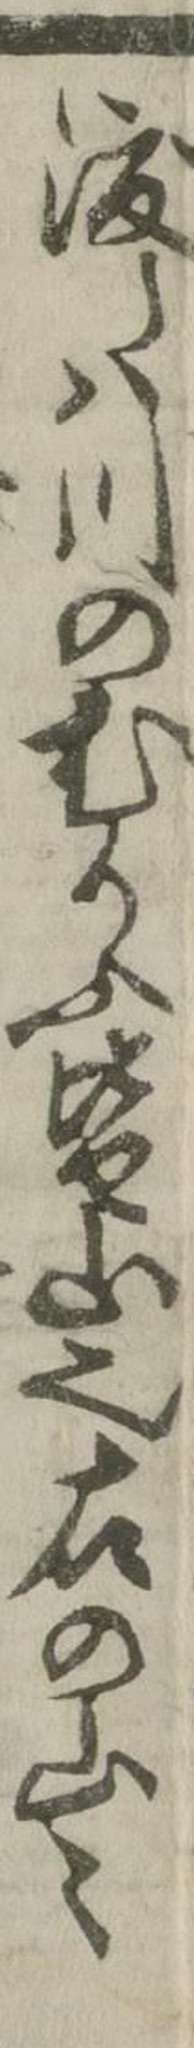渡しは川のむかふ皆山也右の山々
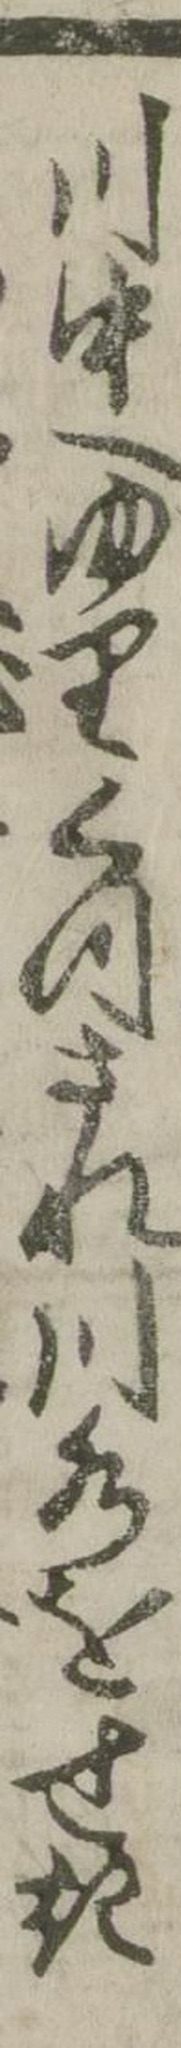川中へゆりくつされ川水をせき
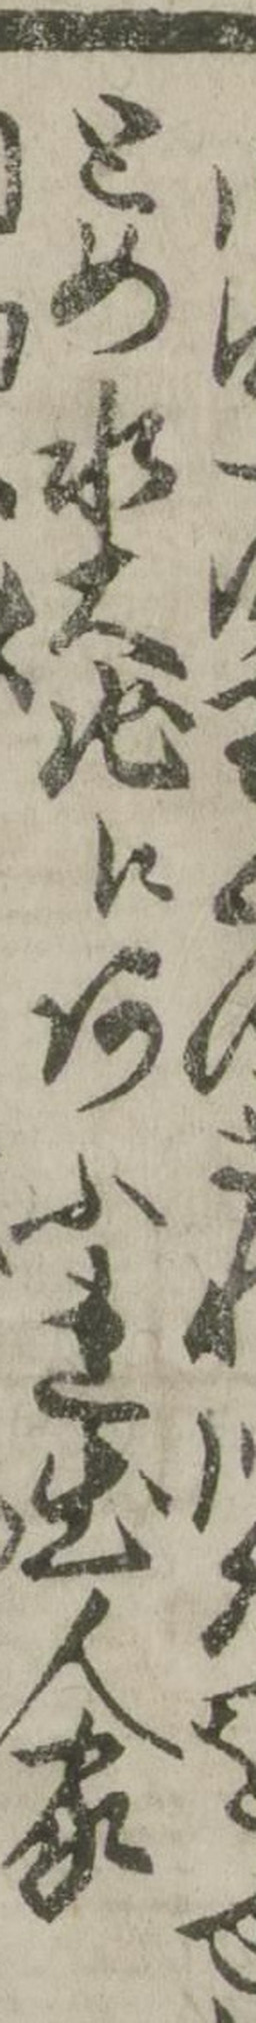とめ水大地江あふれ出人家
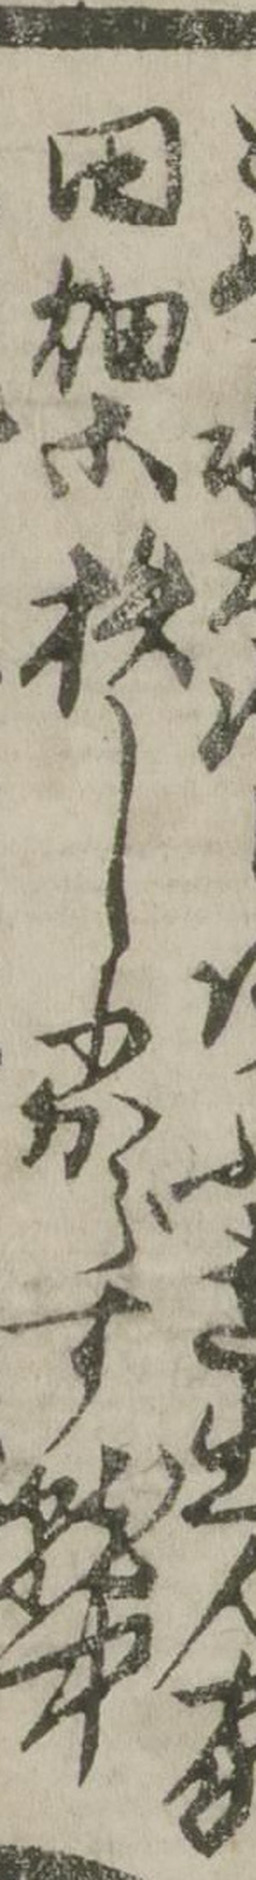田畑等損し少からす就中
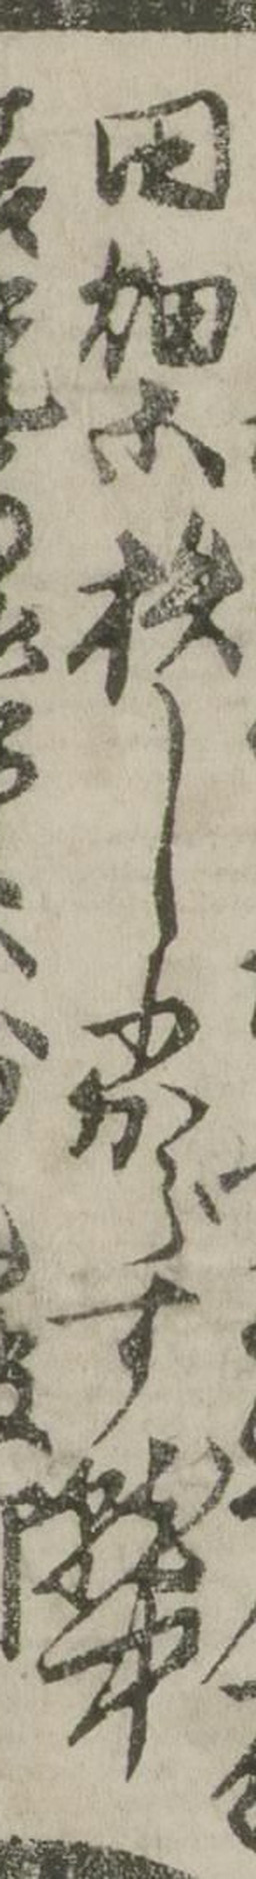田畑等損し少からす就中
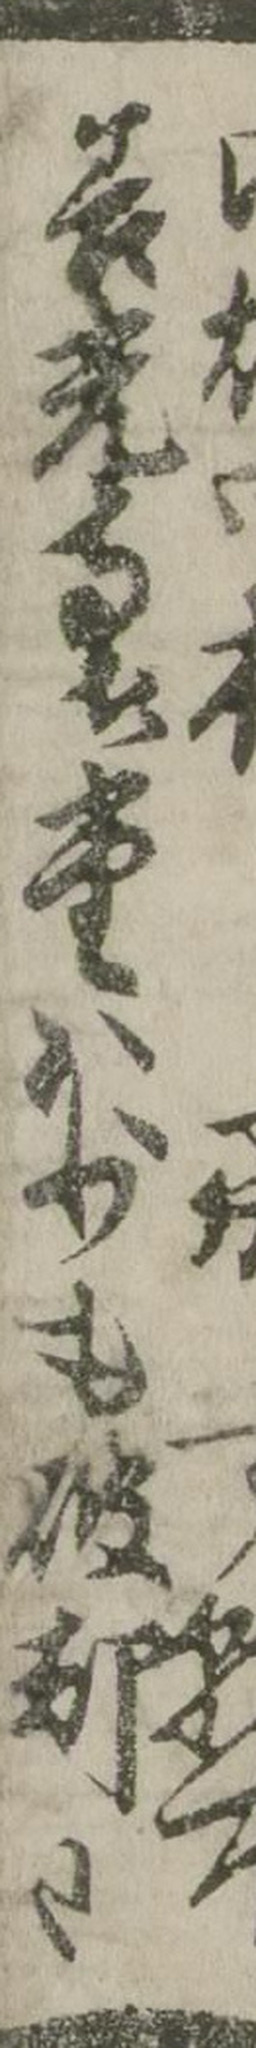善光寺本堂ハ少も破却二
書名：[善光寺地震に関する瓦版]
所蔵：東京大学地震研究所図書室 Earthquake Research Institute Library, The University of Tokyo, JAPAN
